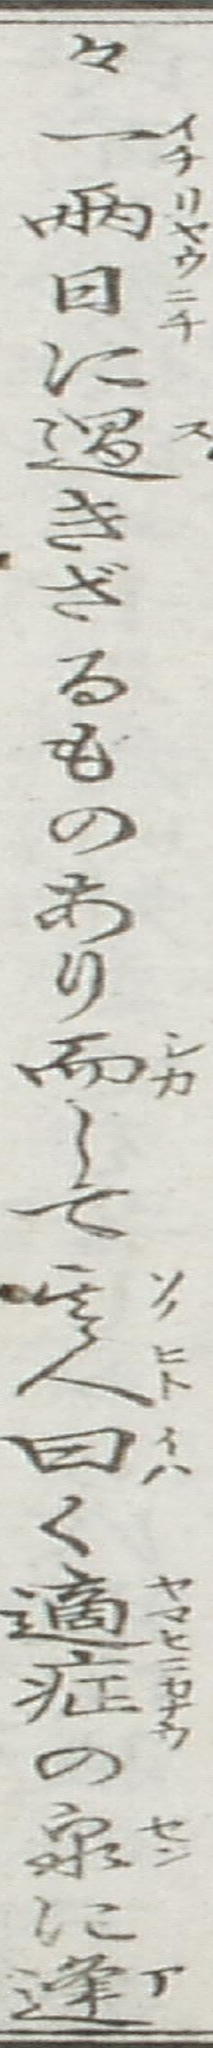々一両日に過きざるものあり而して其人曰く適症の泉に逢
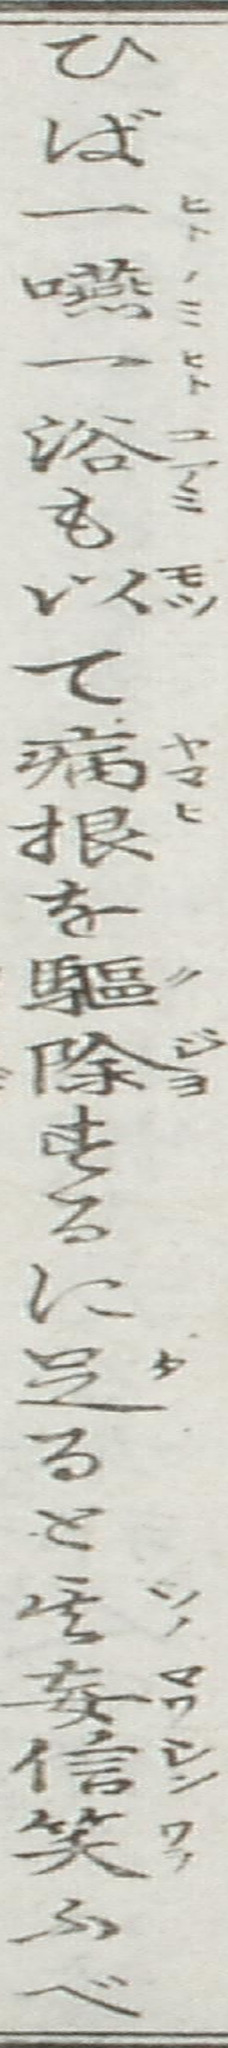ひば一嚥一浴も以て病根を駆除するに足ると其妄信笑ふべ
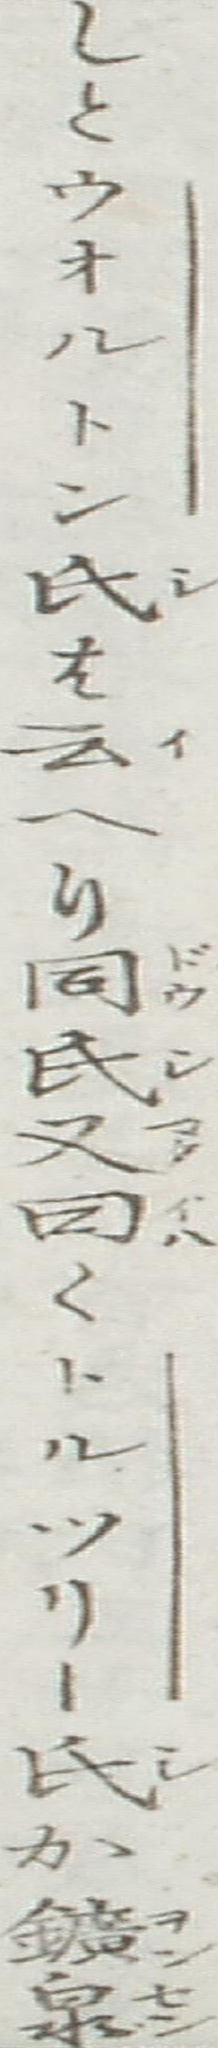しとウオルトン氏は云へり同氏又曰くトルツリー氏か鉱泉
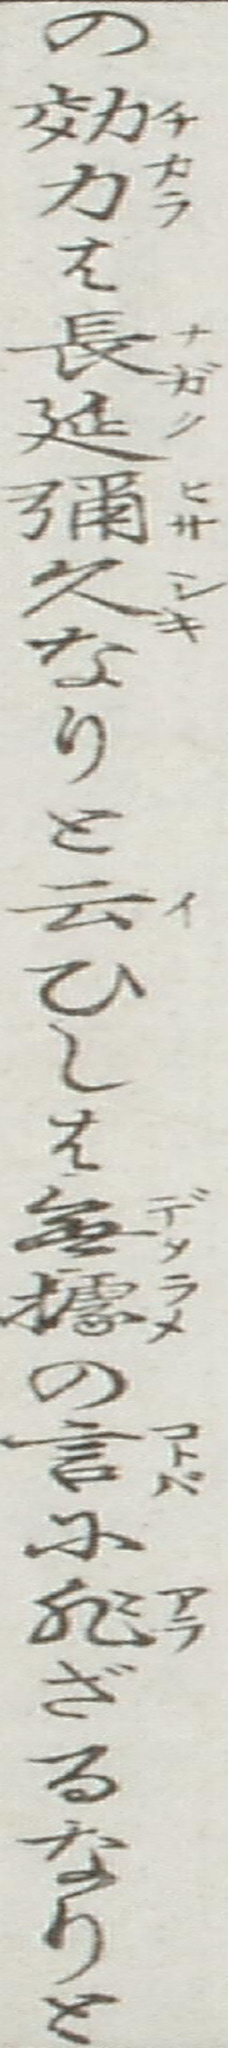の效力は長延彌久なりと云ひしは無據の言に非ざるなりと

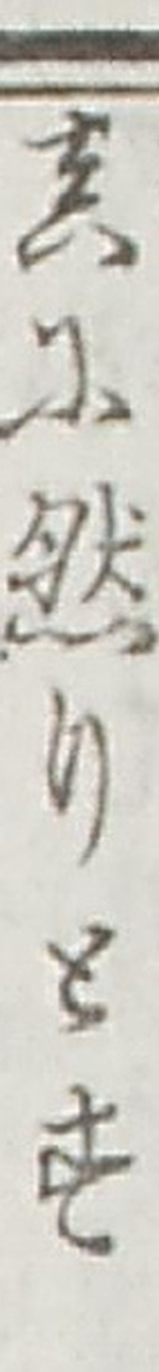真に然りとす
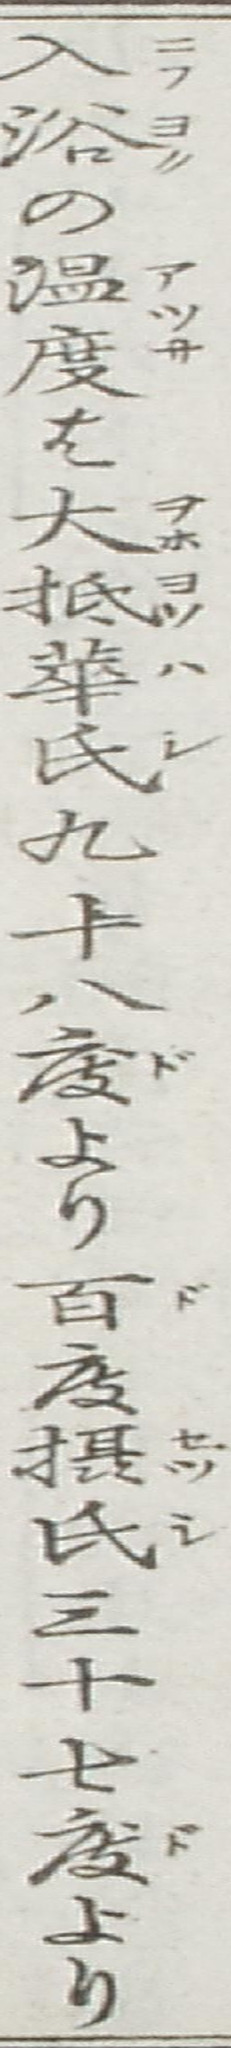入浴の温度は大抵華氏九十八度より百度摂氏三十七度より
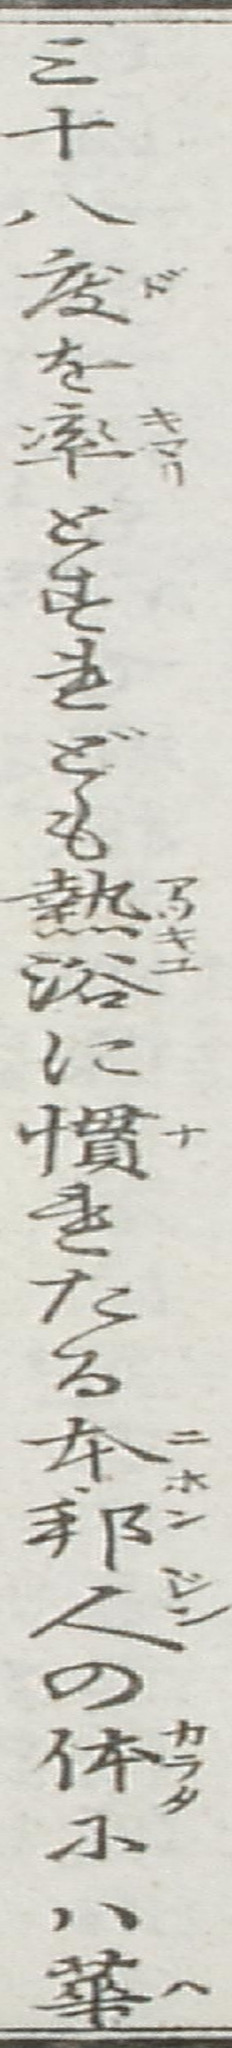三十八度を率とすれども熱浴に慣れたる本邦人の体には華
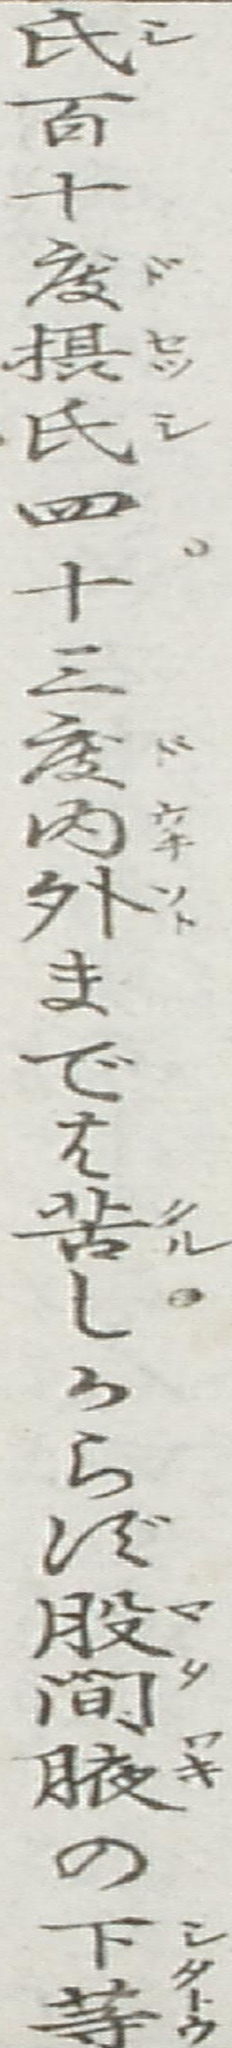氏百十度摂氏四十三度内外までは苦しからず股間腋の下等
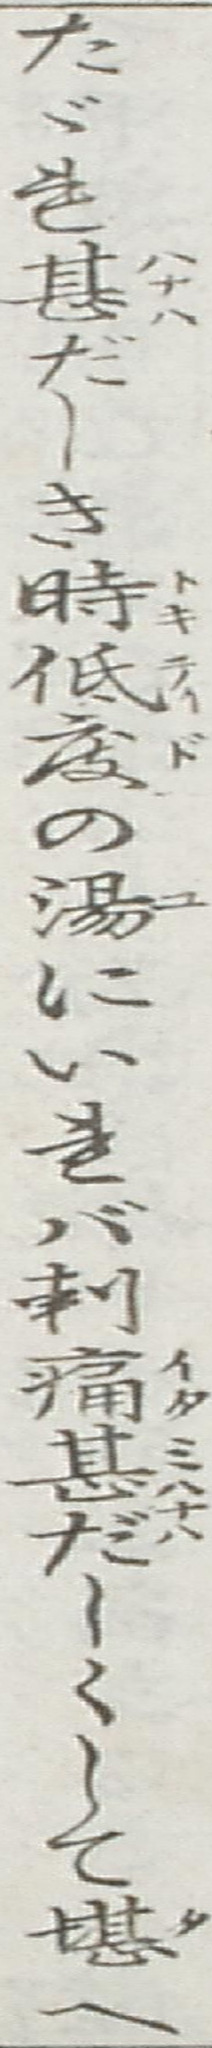たゞれ甚だしき時低度の湯にいれバ刺痛甚だしくして堪へ
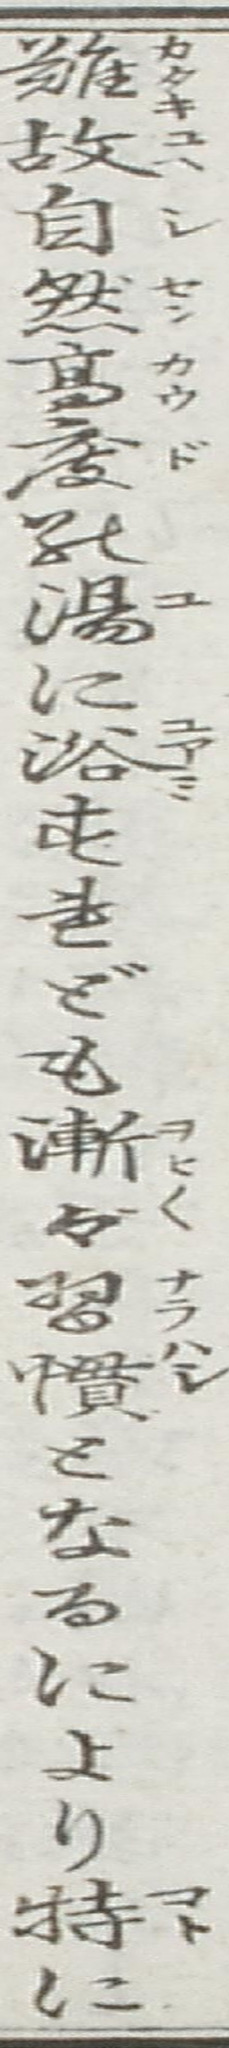難故自然高度の湯に浴すれども漸々習慣となるにより特に
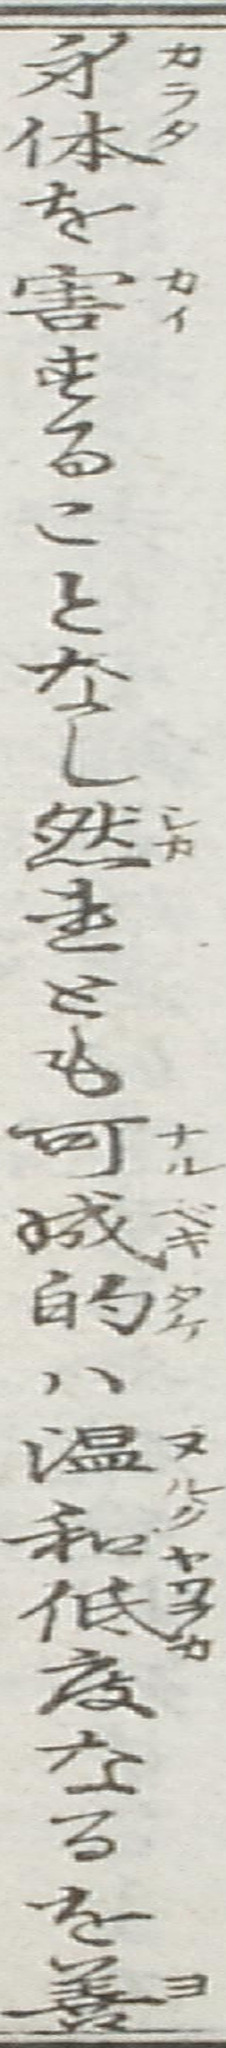身体を害することなし然れとも可成的ハ温和低度なるを善
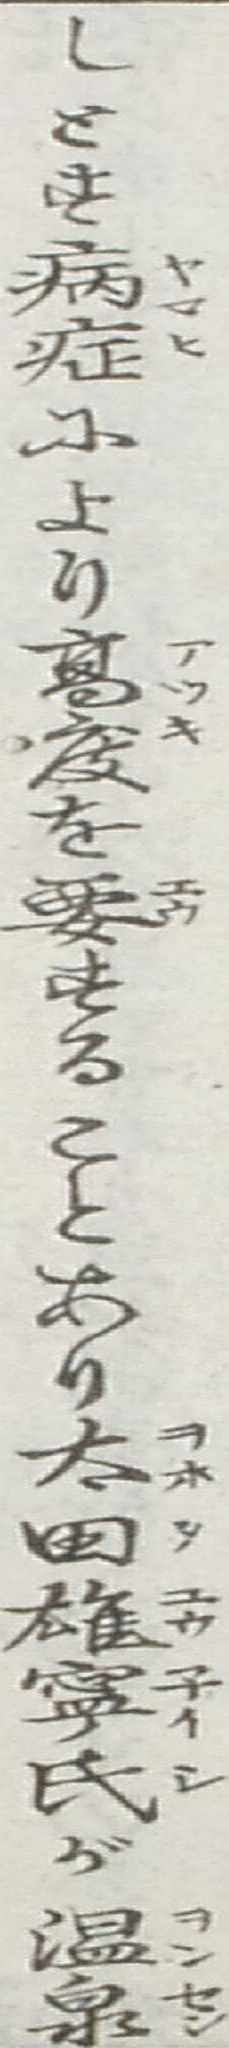しとす病症により高度を要することあり太田雄寧氏が温泉
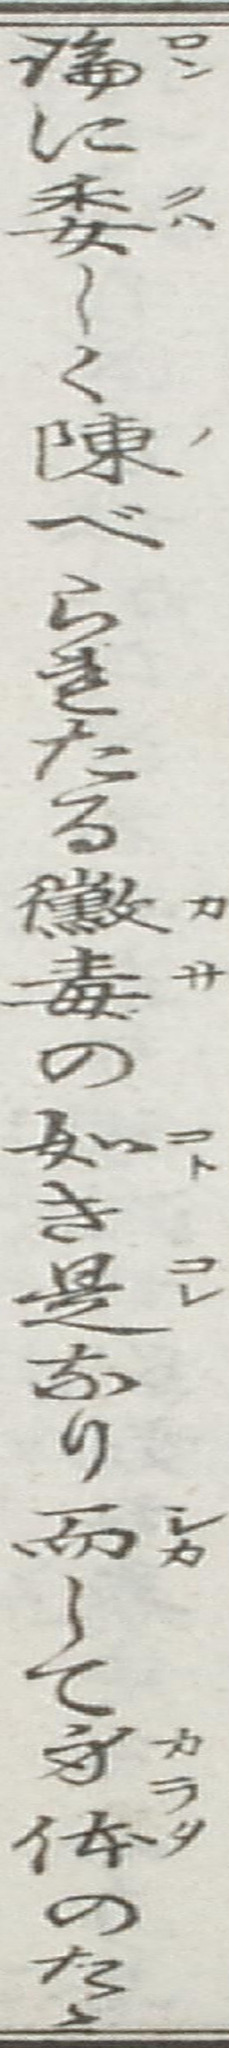論に委しく陳べられたる黴毒の如き是なり而して身体のたゝ
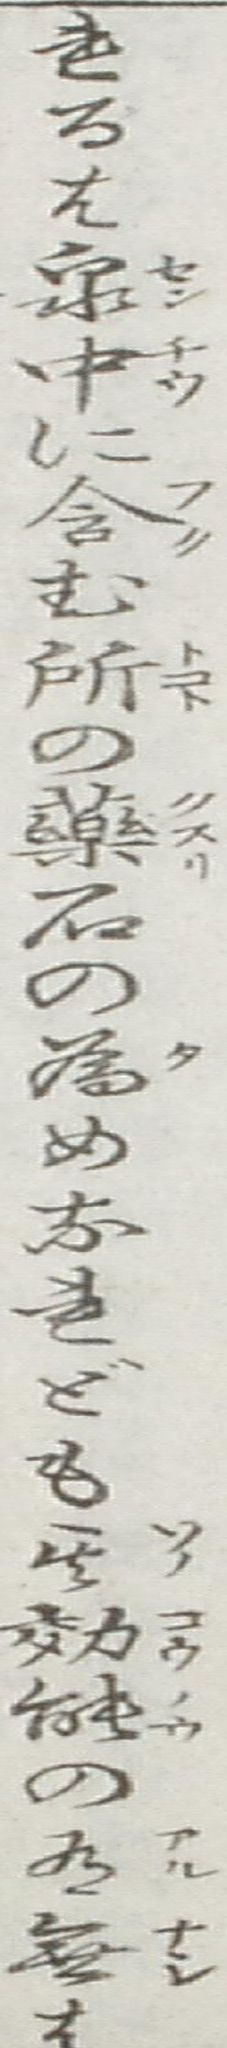れるは泉中に含む所の薬石の為めなれども其効能の有無は
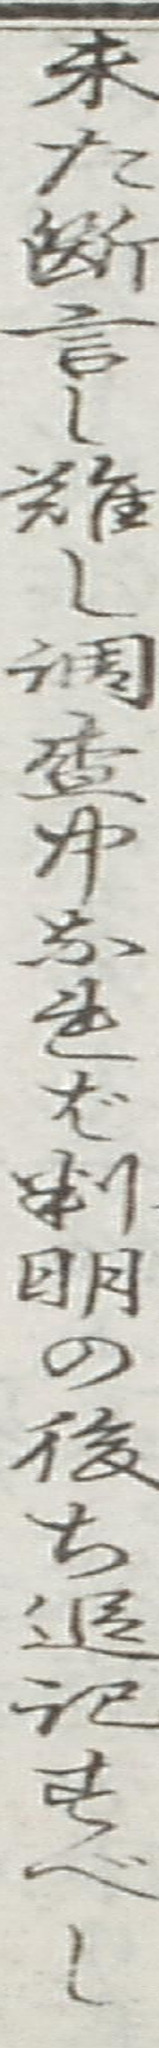未た断言し難し調査中なれば判明の後ち追記すべし
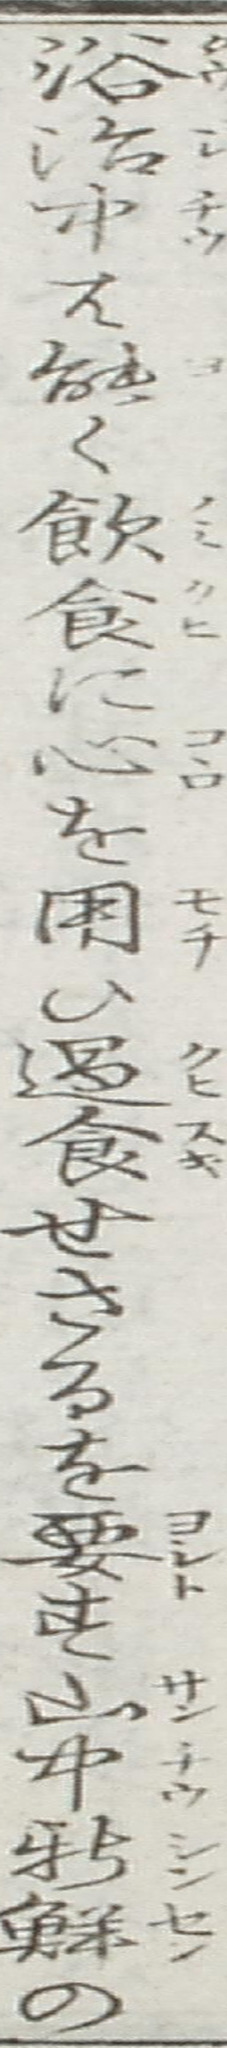浴治中は能く飲食に心を用ひ過食せさるを要す山中新鮮の
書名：草津温泉誌　全
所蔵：東京大学地震研究所図書室 Earthquake Research Institute Library, The University of Tokyo, JAPAN
